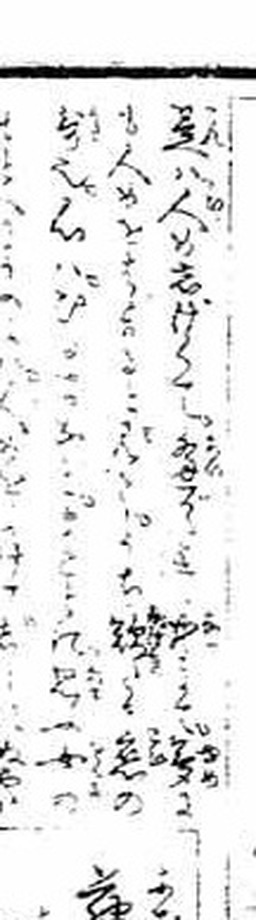も人めをはゞかると見てうち歎きたる恋の藤原
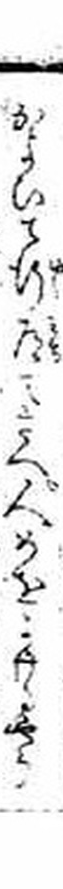かよひて行道てさへ人目めをさけて
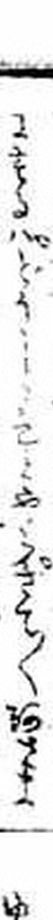にするはどうしたことやらさて〳〵あさま
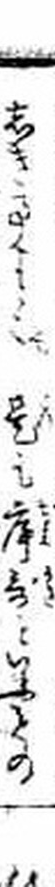しき事也是も序詞といふもの行
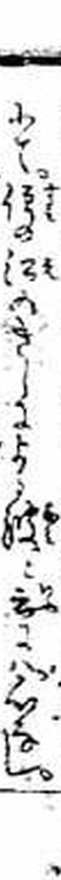にて住の江のきしによる波と云は心なし朝
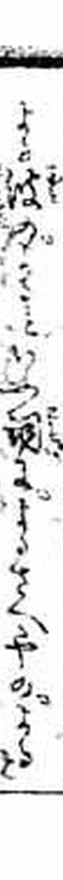よる波のよるといふ詞によるさへやのよる臣
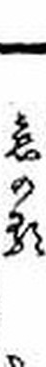恋の哥
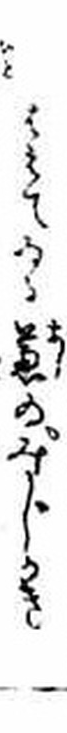はえてゐる葦のみぢかき
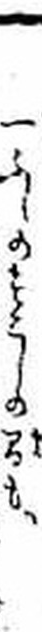一ふしのすこしの夜も
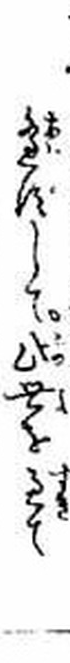逢ずして此世を過て
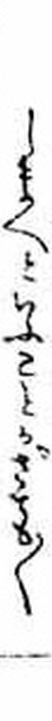しまへといふことかさても〳〵
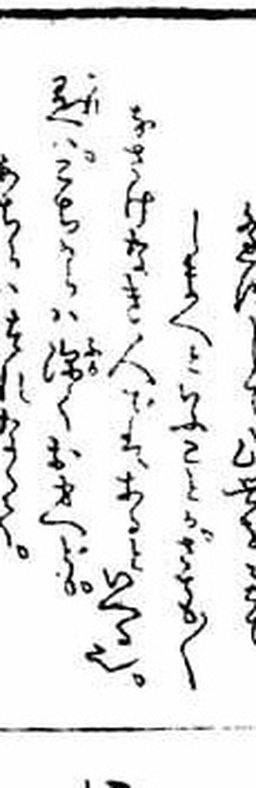なさけなき人ではあるといへる也伊
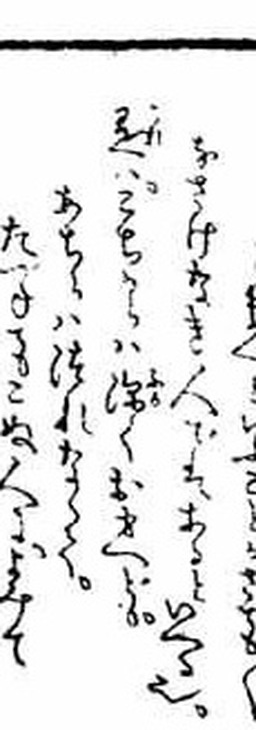是はこちうらは深くおもへども勢
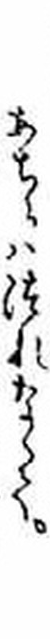あちらはつれなくて
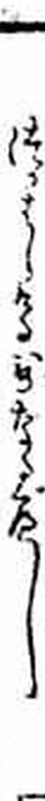つかはしける哥なるべし
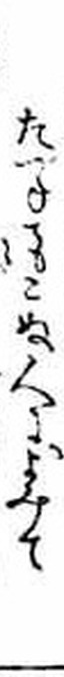たづねてもこぬ人によみて
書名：小倉百人一首
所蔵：東京学芸大学教育コンテンツアーカイブ
